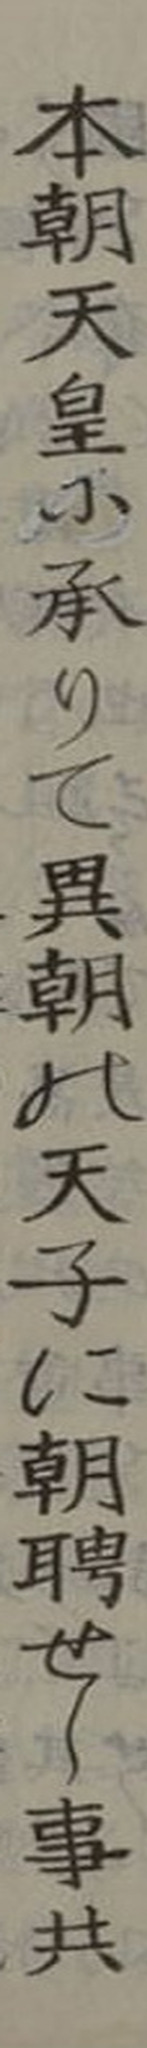本朝天皇に承りて異朝の天子に朝聘せし事共

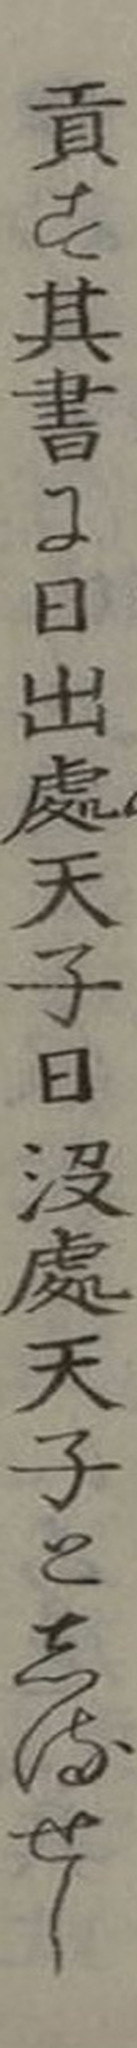貢す其書に日出處天子日沒處天子としるせし
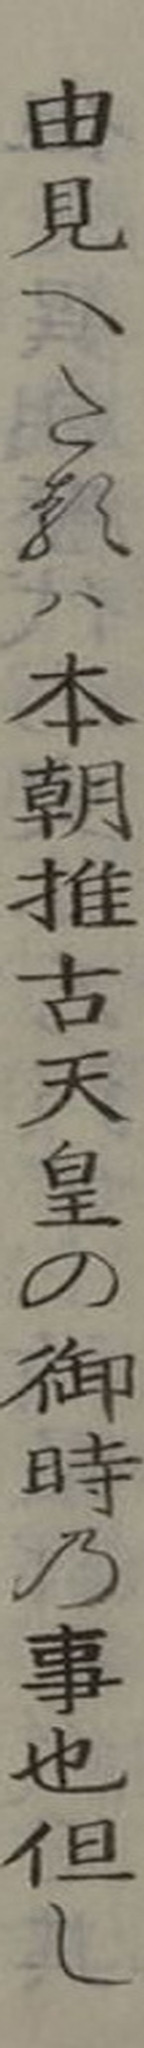由見へたれハ本朝推古天皇の御時の事也但し
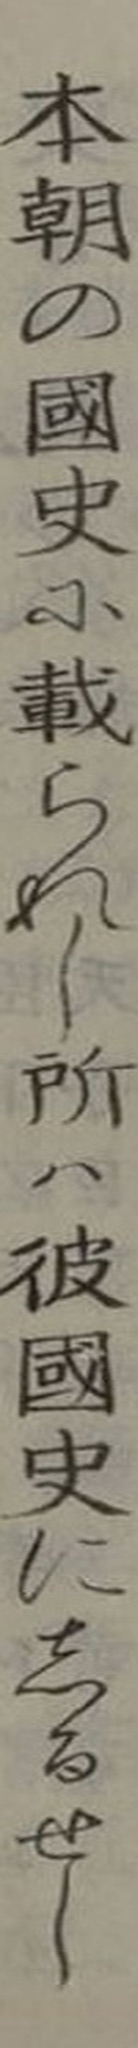本朝の國史に載られし所ハ彼國史にしるせし
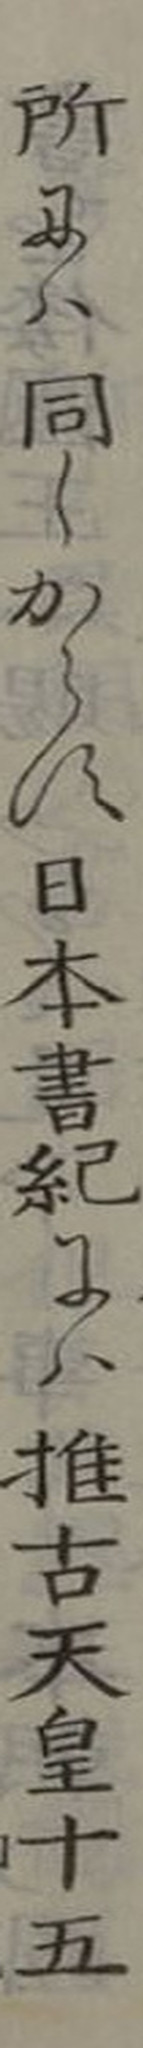所にハ同しからす日本書紀にハ推古天皇十五
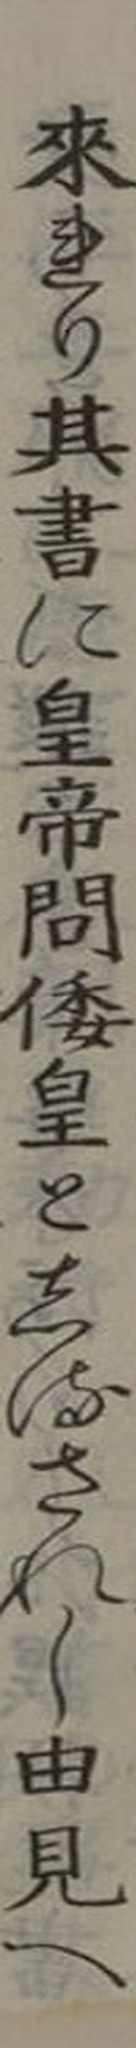來れり其書に皇帝問倭皇としるされし由見へ
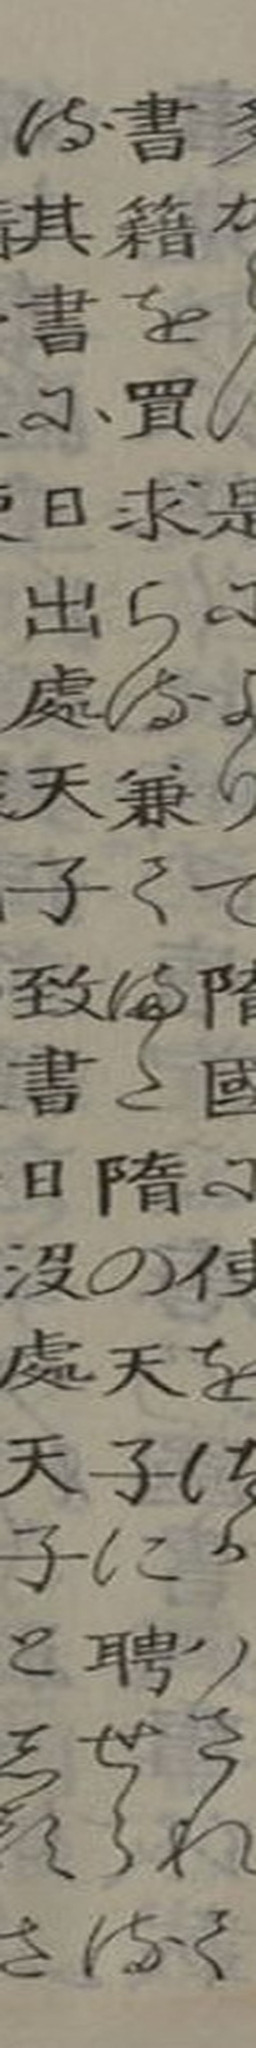貢す其書に日出處天子日沒處天子としるせし
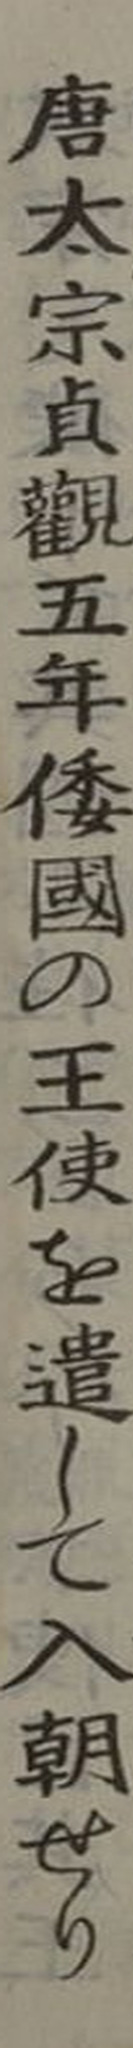唐太宗貞觀五年倭國の王使を遣して入朝せり

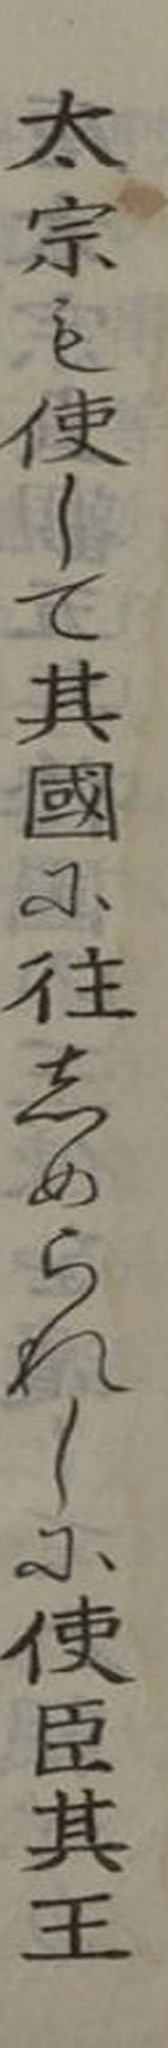太宗も使して其國に往しめられしに使臣其王
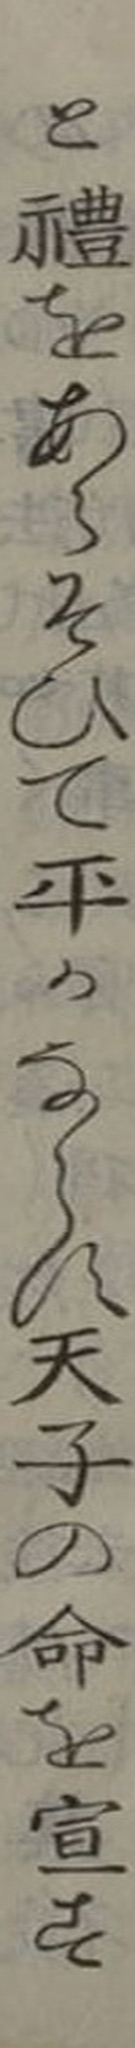と禮をあらそひて平かならす天子の命を宣す
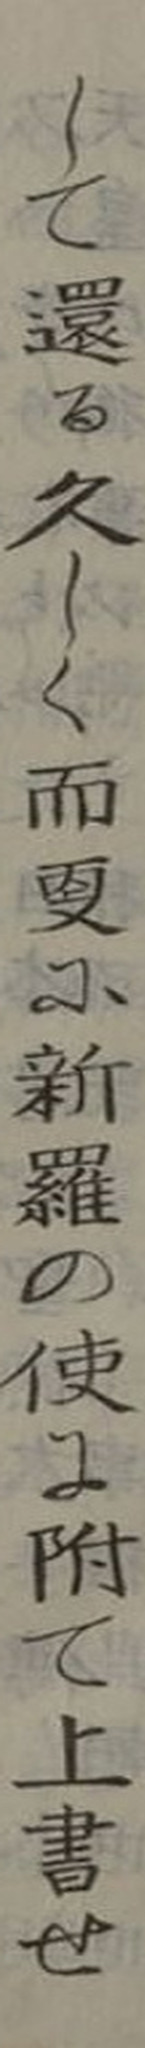して還る久しく而㪅に新羅の使に附て上書せ
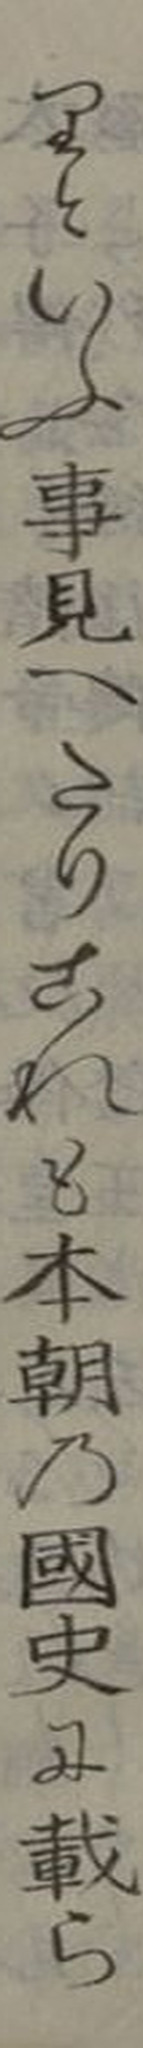りといふ事見へたりこれも本朝の國史に載ら
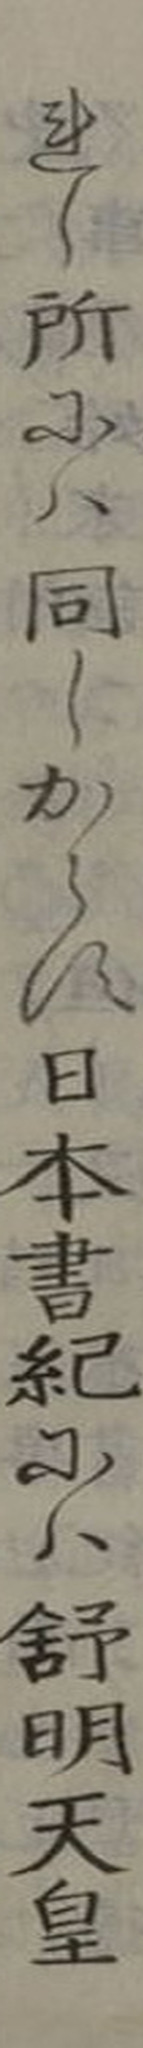れし所にハ同しからす日本書紀にハ舒明天皇
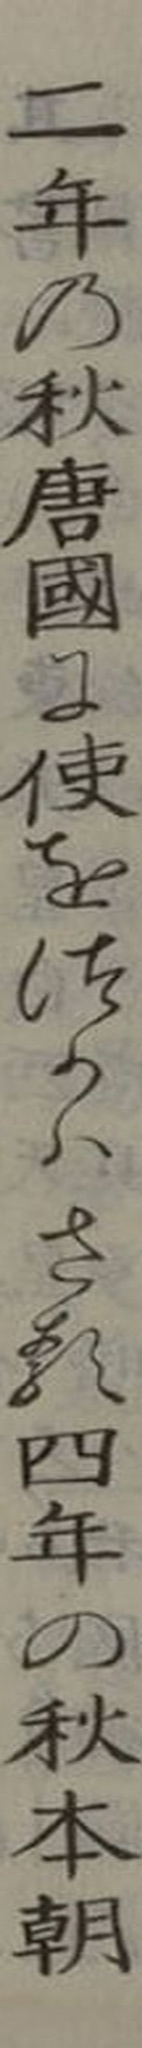二年の秋唐國に使をつかハさる四年の秋本朝
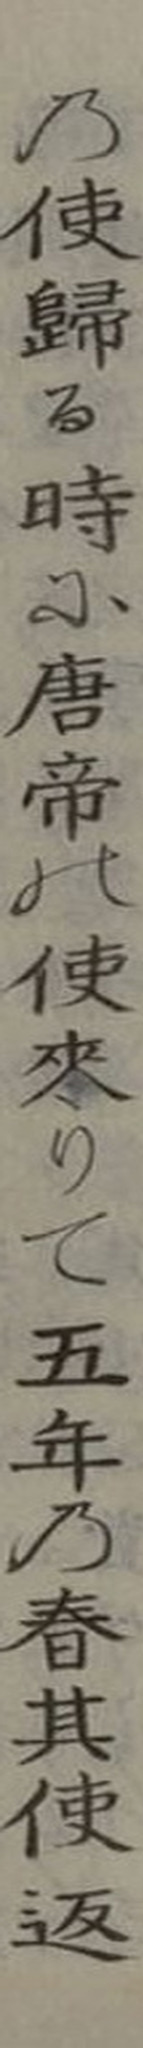の使歸る時に唐帝の使來りて五年の春其使返
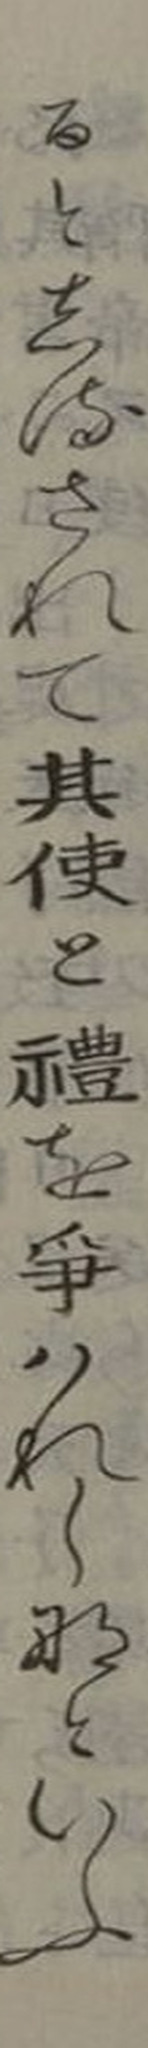るとしるされて其使と禮を爭ハれしなといふ
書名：骨董録
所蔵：University of the Ryukyus Library
